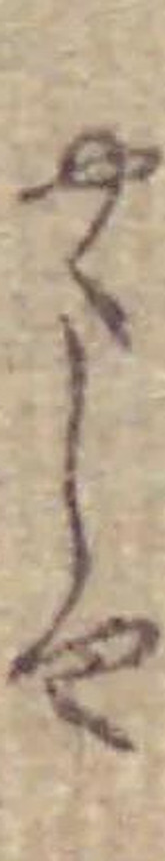やくしや
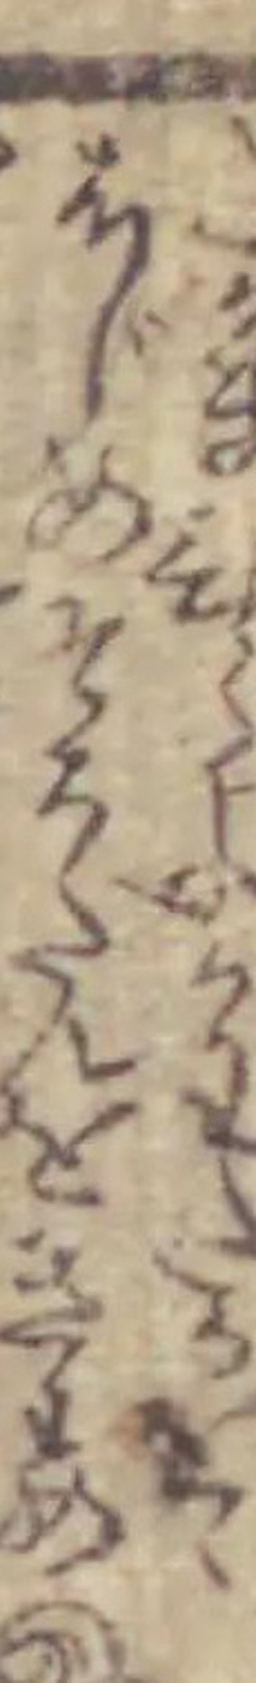はじめそうだんをきわめ
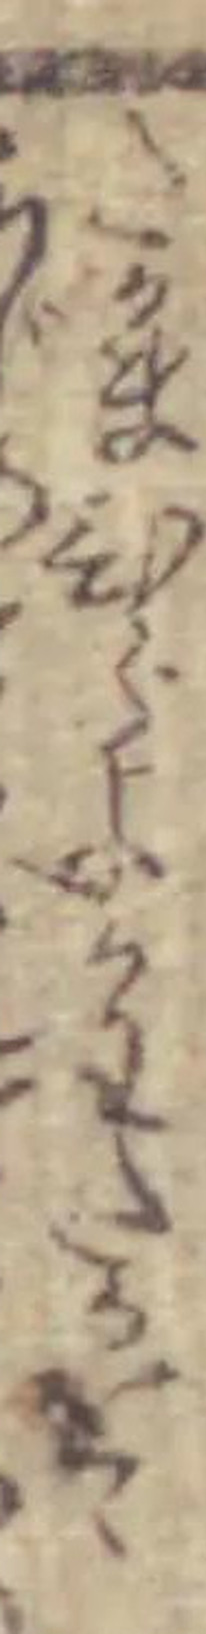たかまひらよかわたかをゝ
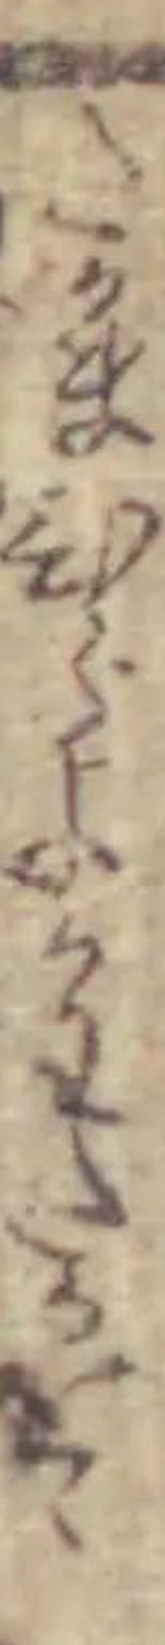たかまひらよかわたかをゝ
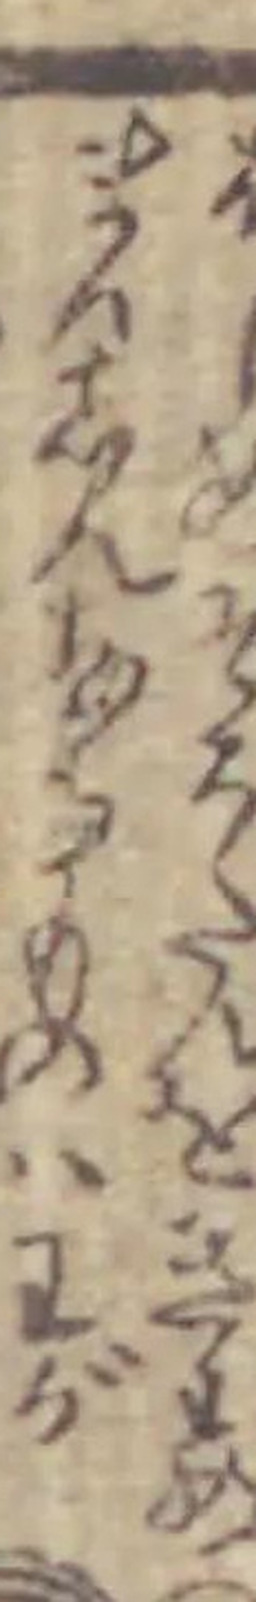まんしんなるものはわが
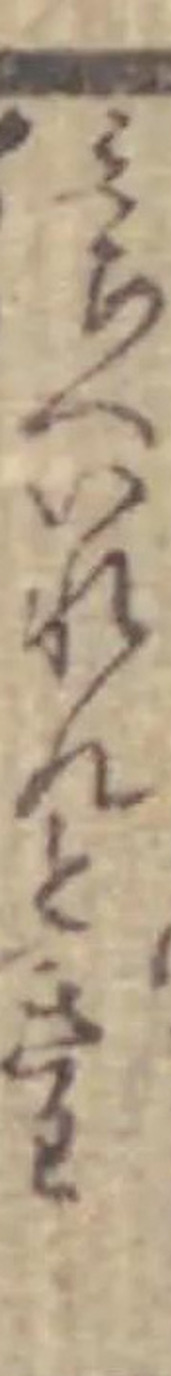みちへいれんときわま
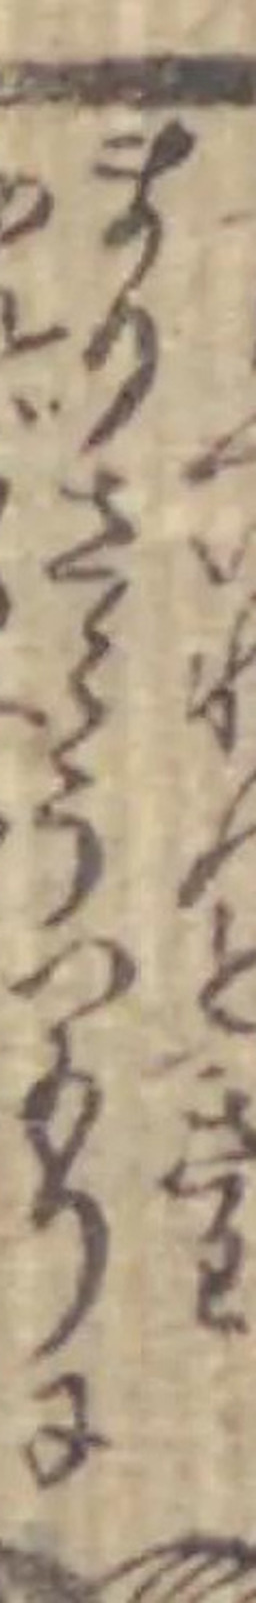わりさらうつもりに
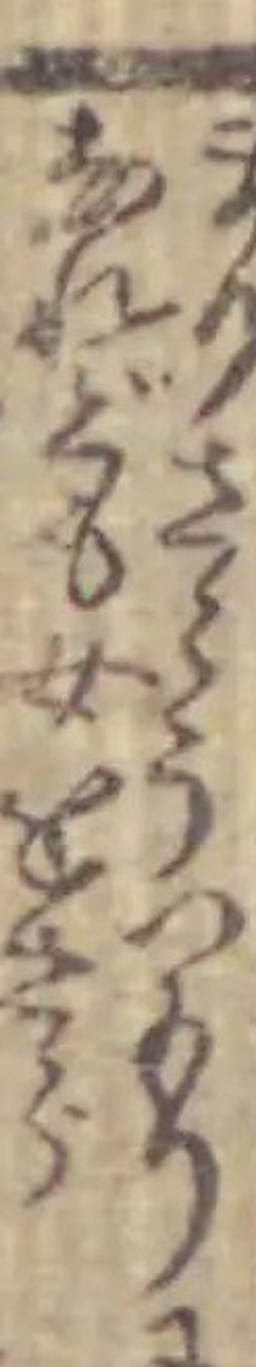なれども女をさら
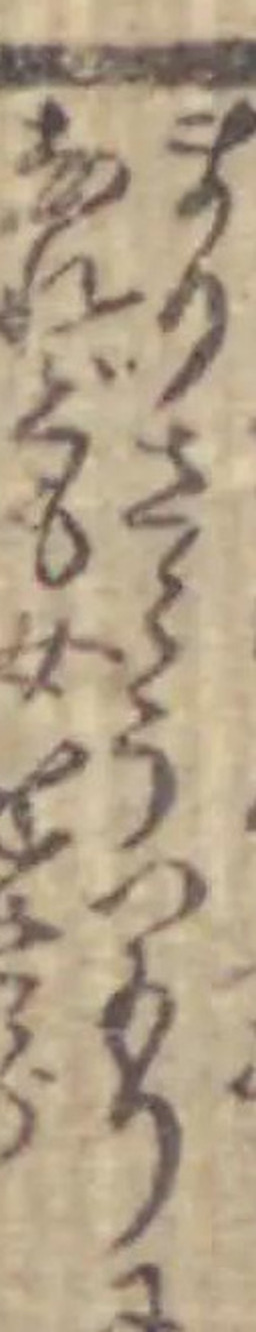なれども女をさら
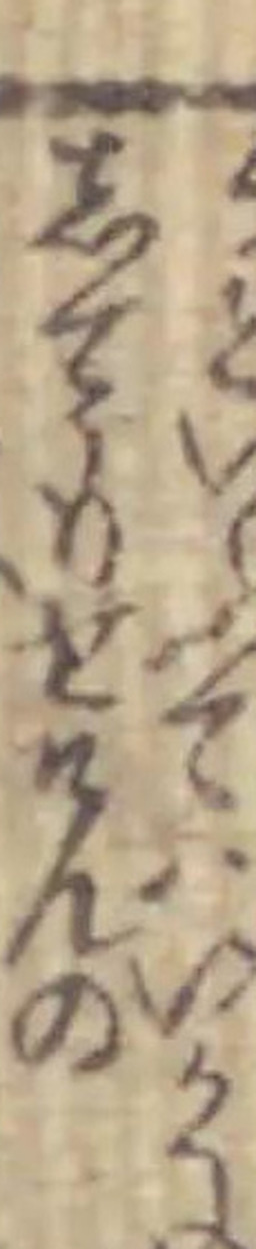してもせけんの
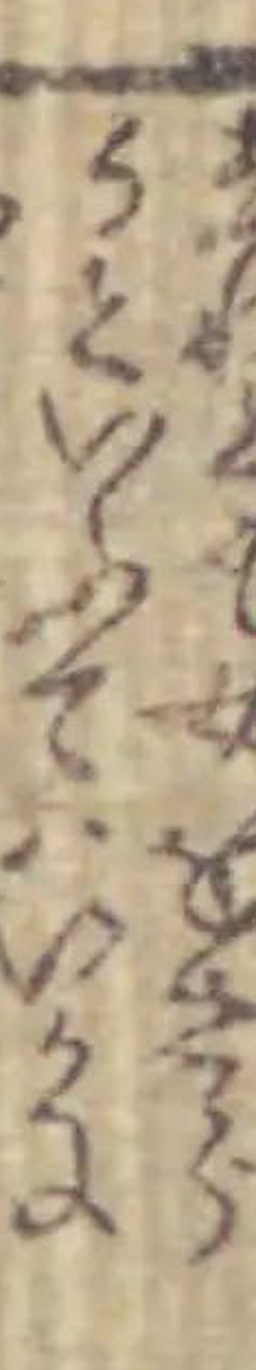うといふてはいかに
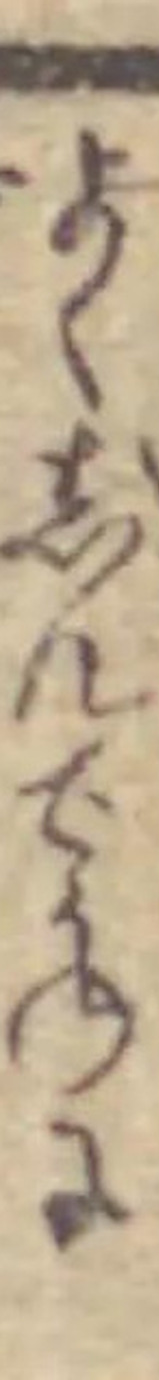よくしんでかねに
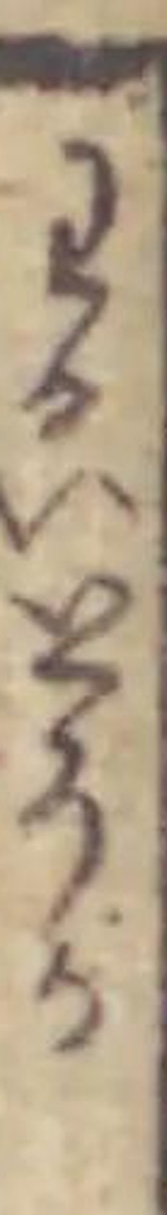わるいとうか
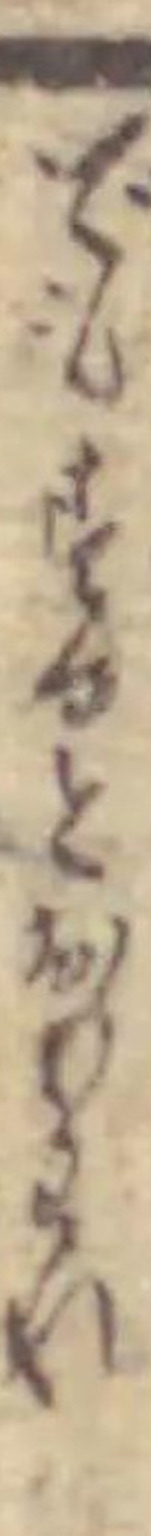でもするとおもわれ
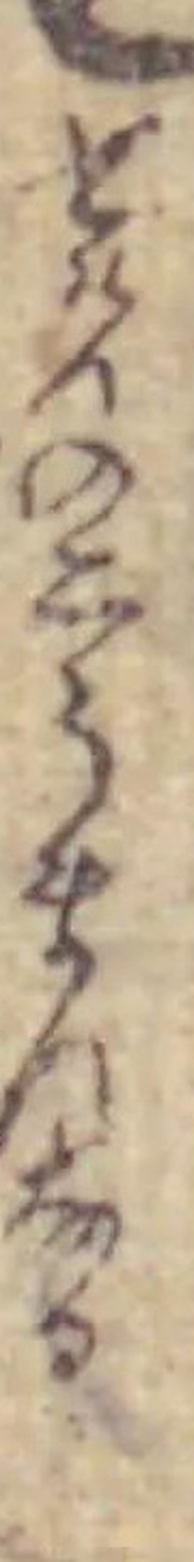せけんのこうまんなる
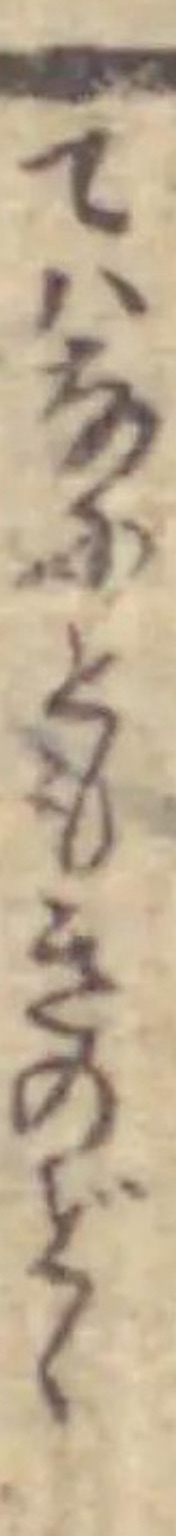てはなにともきのどく
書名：珍説女天狗 2巻
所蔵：国立国会図書館 National Diet Library, JAPAN
